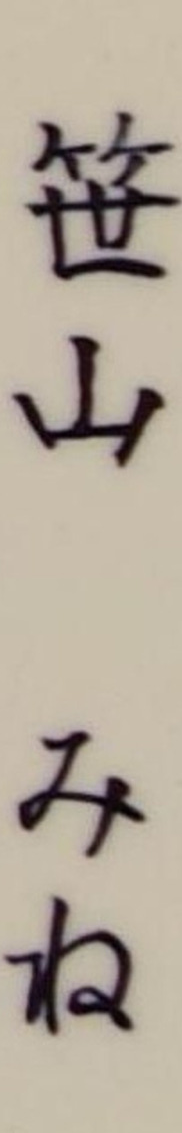笹山みね
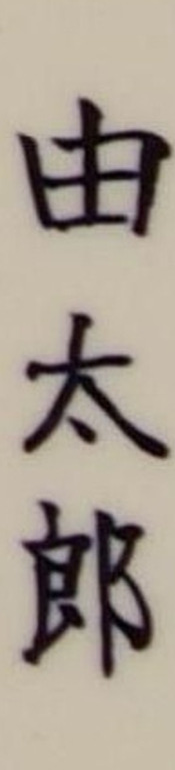由太郎
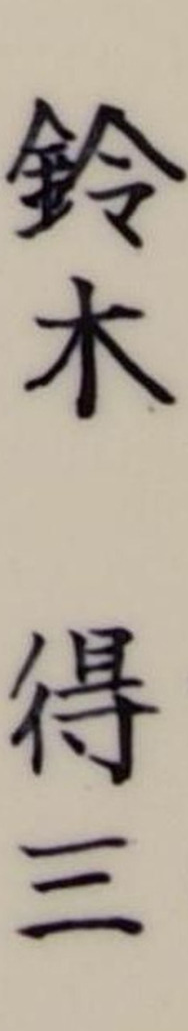鈴木得三
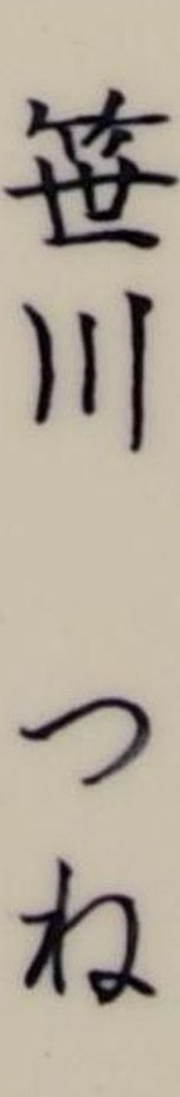笹川つね
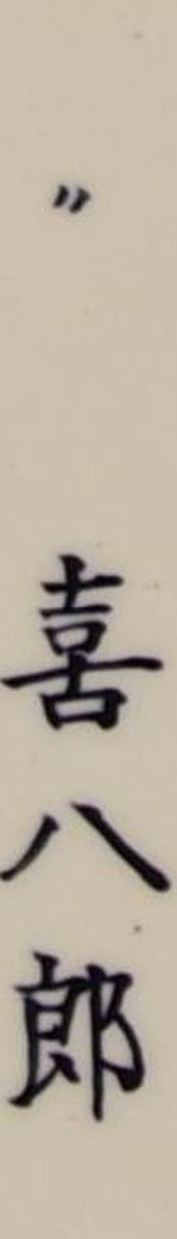喜八郎
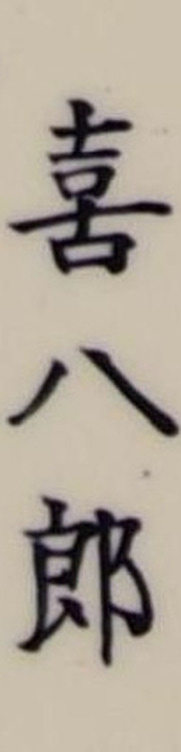喜八郎
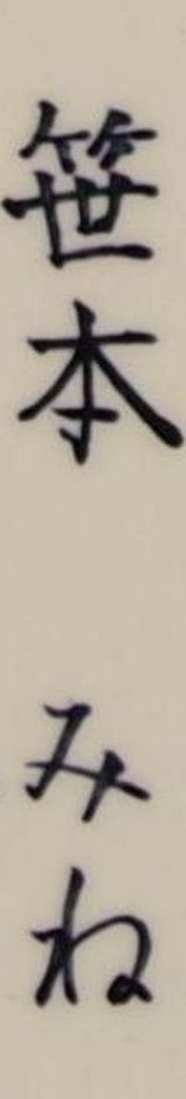笹本みね
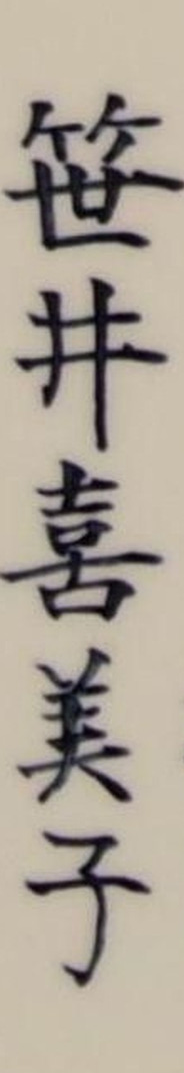笹井喜美子
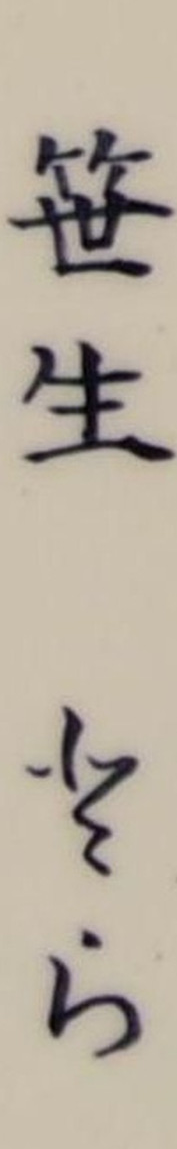笹生とら
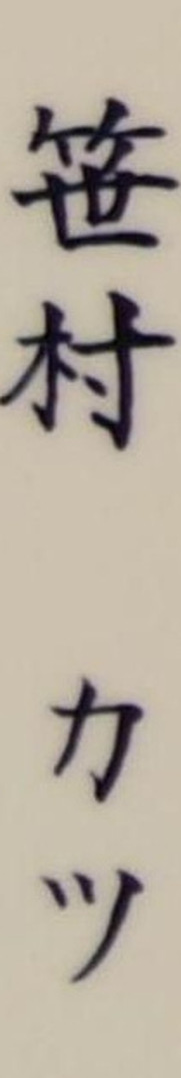笹村カツ
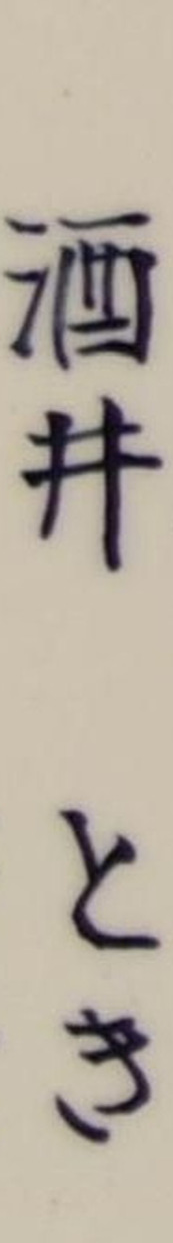酒井とき

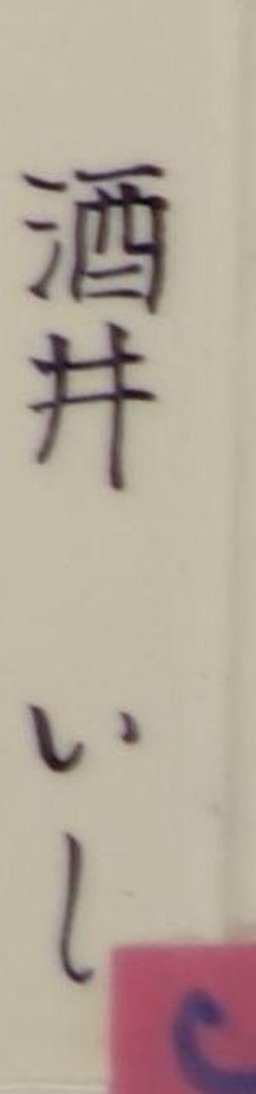酒井いし
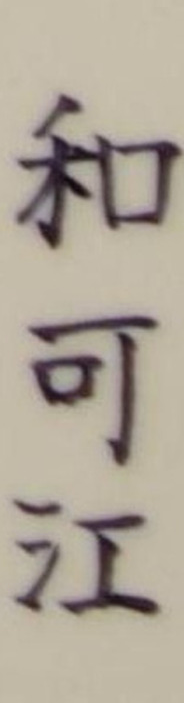和可江
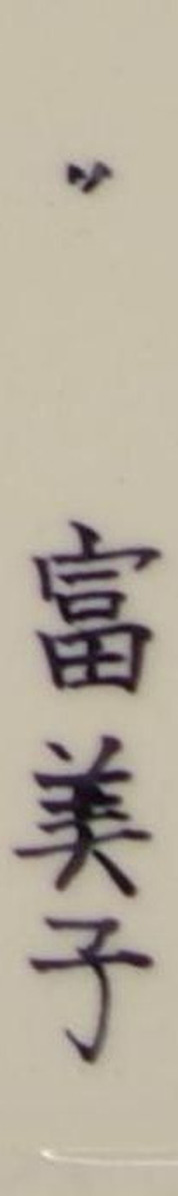富美子
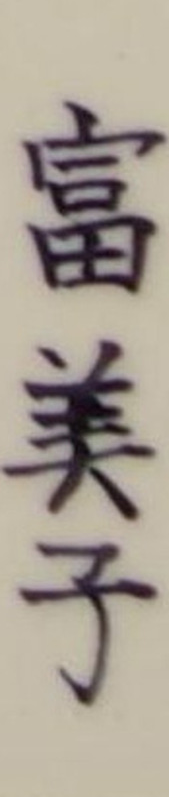富美子
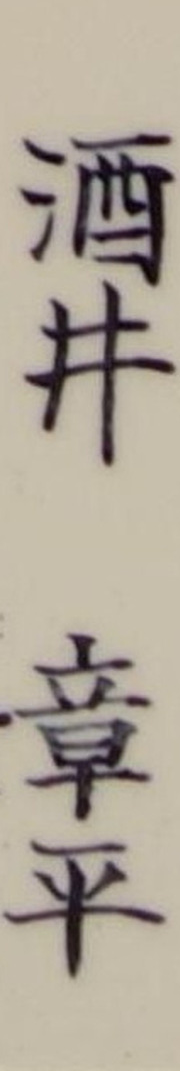酒井章平
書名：E~L
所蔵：高野山金剛峯寺
